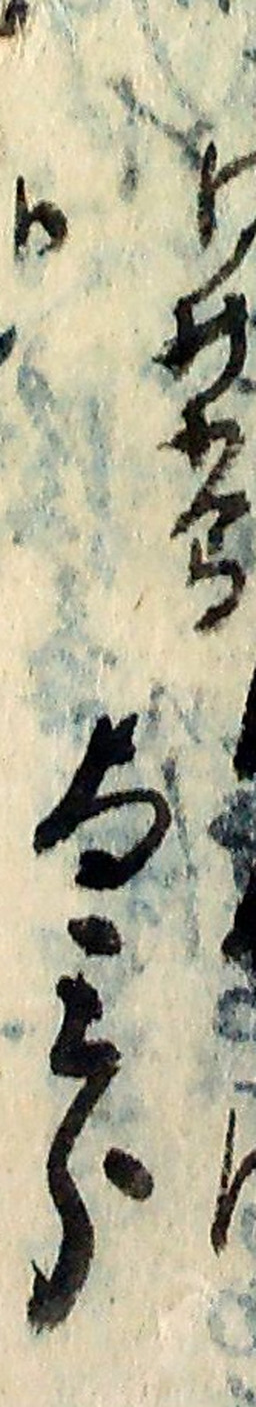与三郎
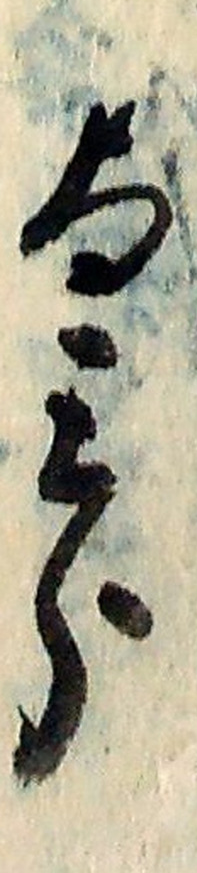与三郎
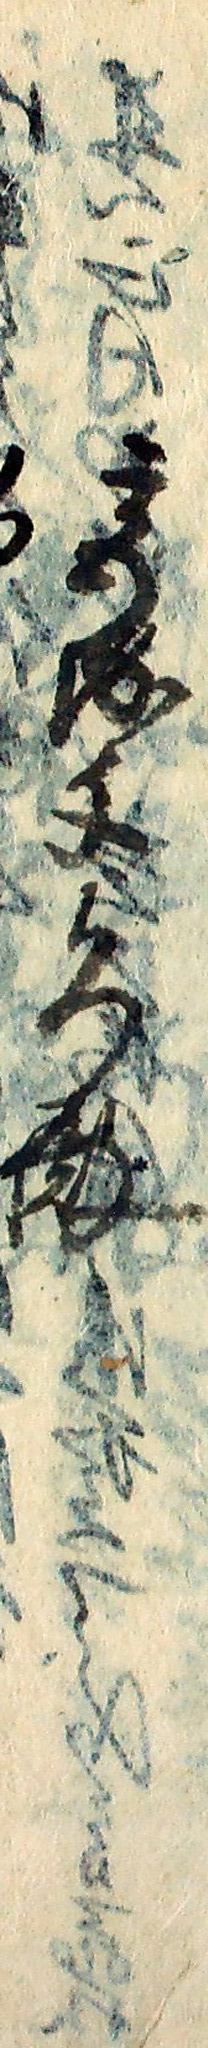宮城文右衛門殿
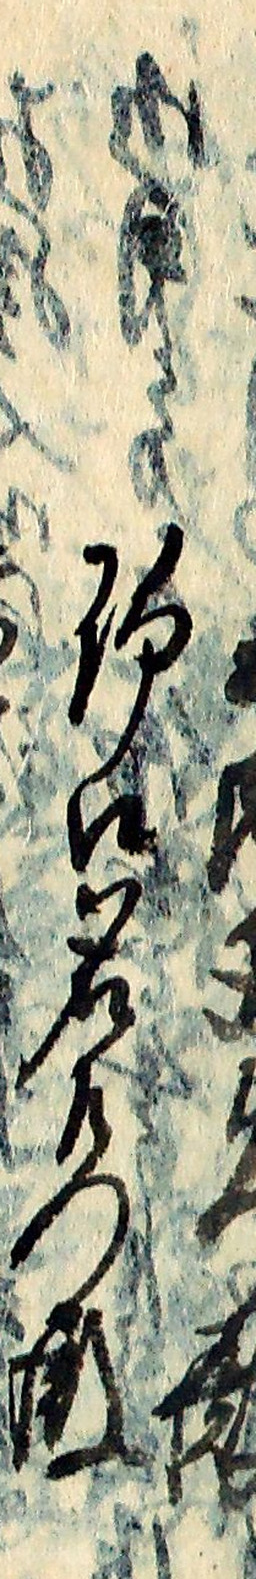野口名左衛門殿
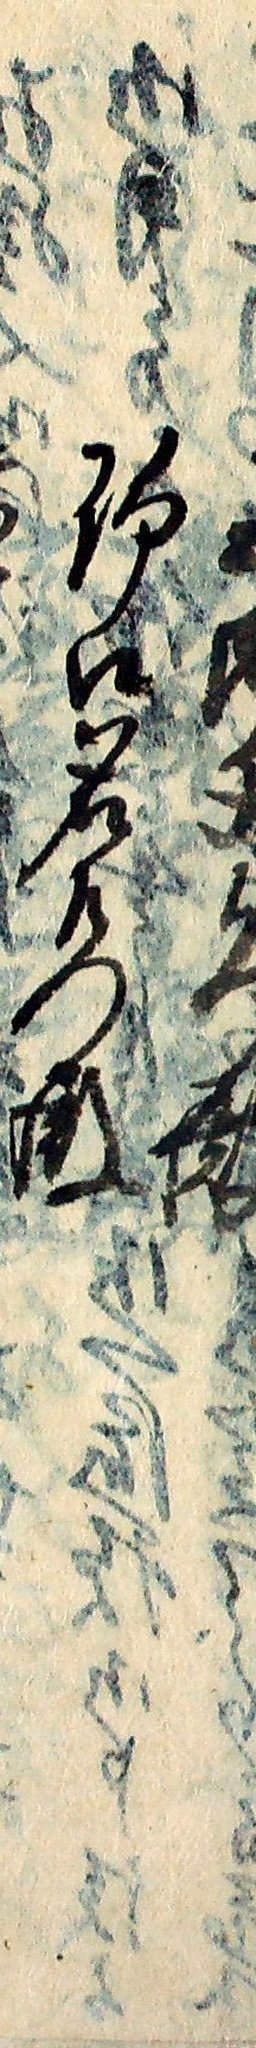野口名左衛門殿
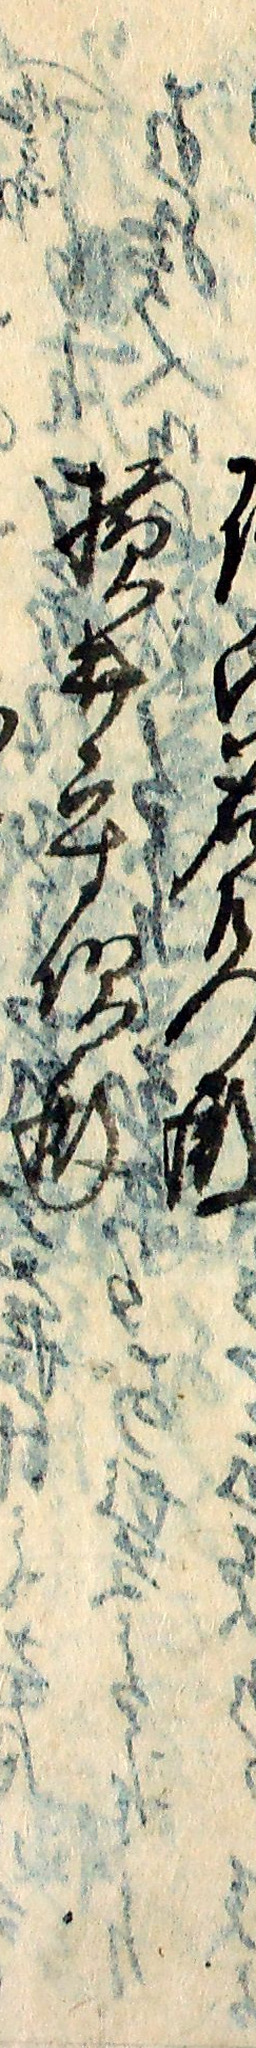横井守次殿
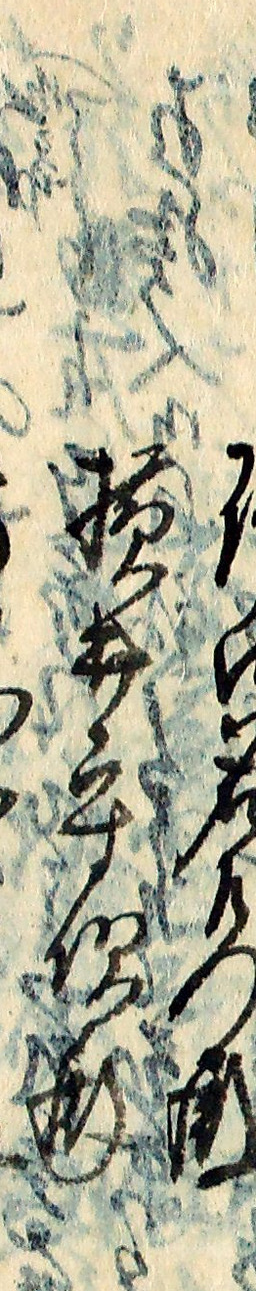横井守次殿
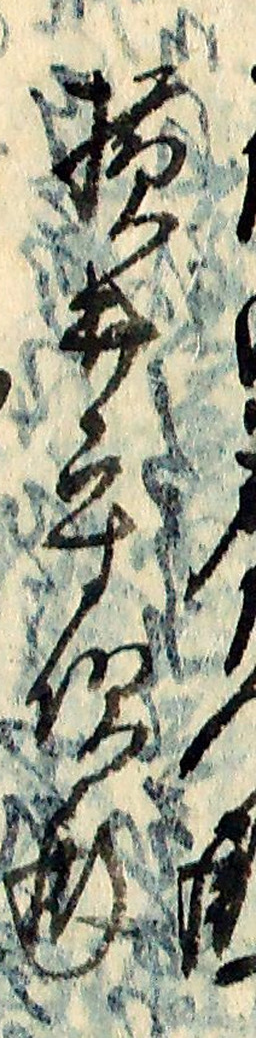横井守次殿
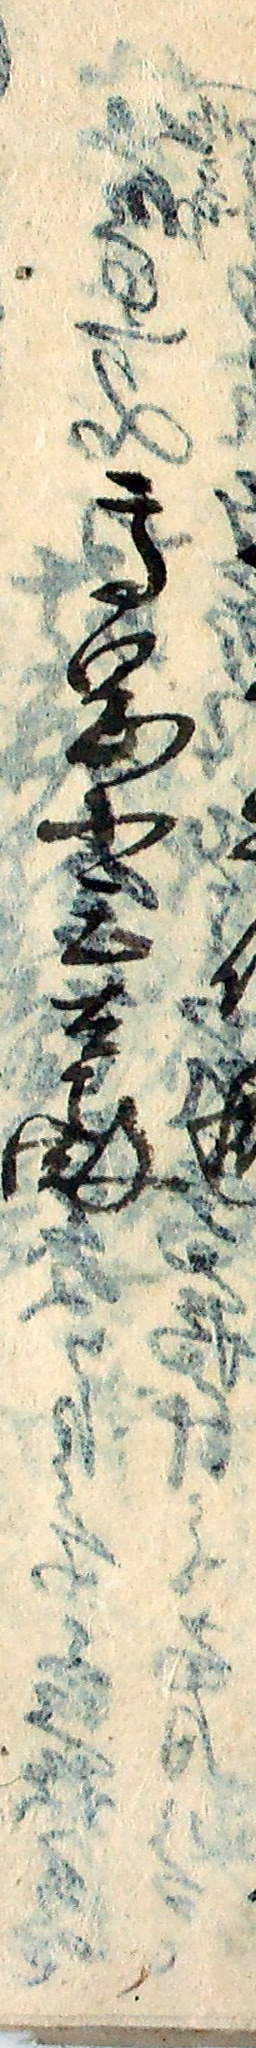高岡小三太殿
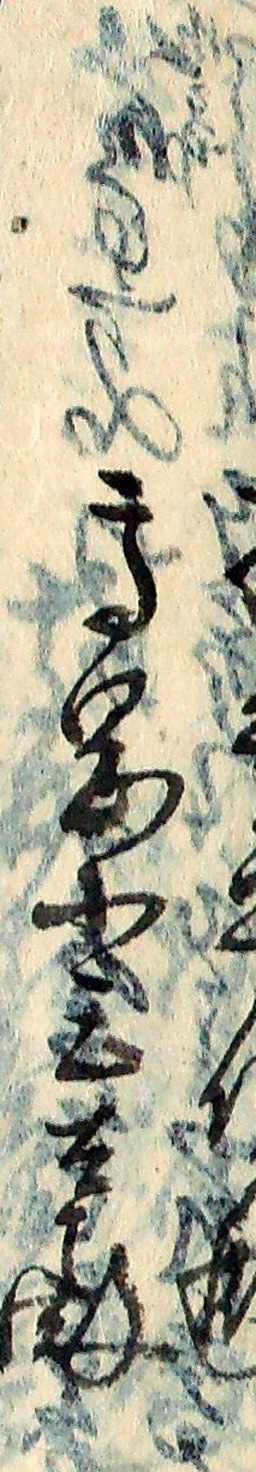高岡小三太殿

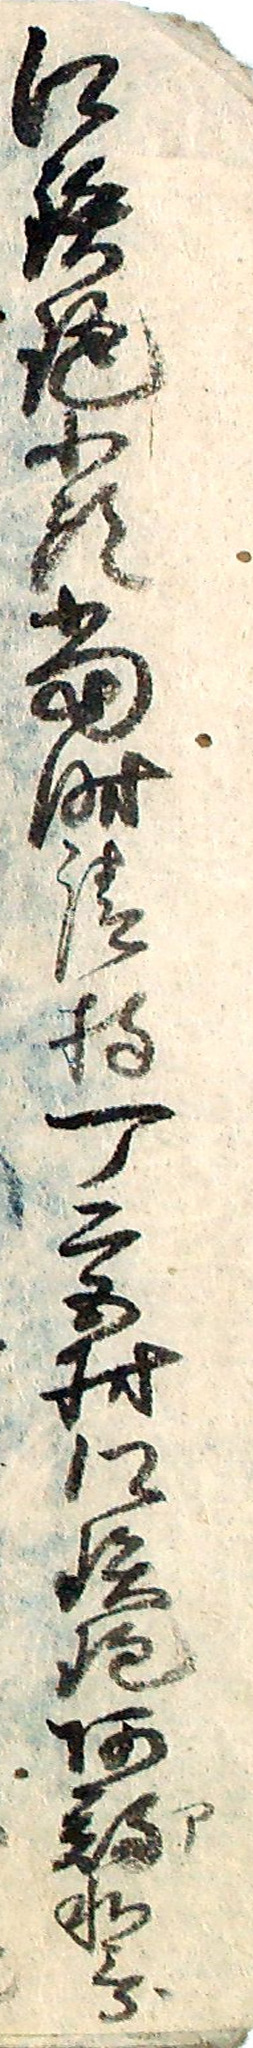郷鉄砲小頭当時請持一ノ宮村郷鉄砲阿部和三郎
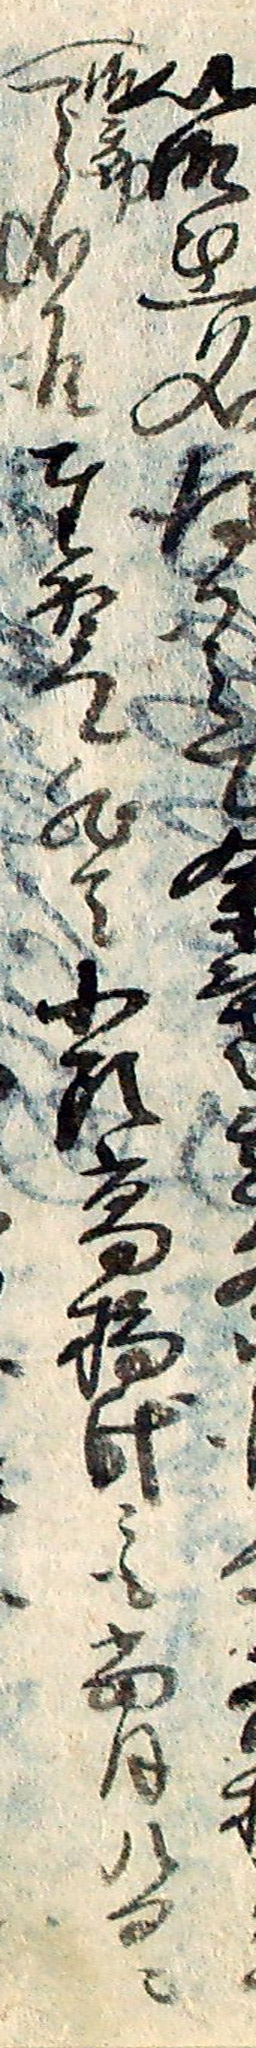御勤可被成御座奉賀候然は小頭高橋氏にも当月八日に
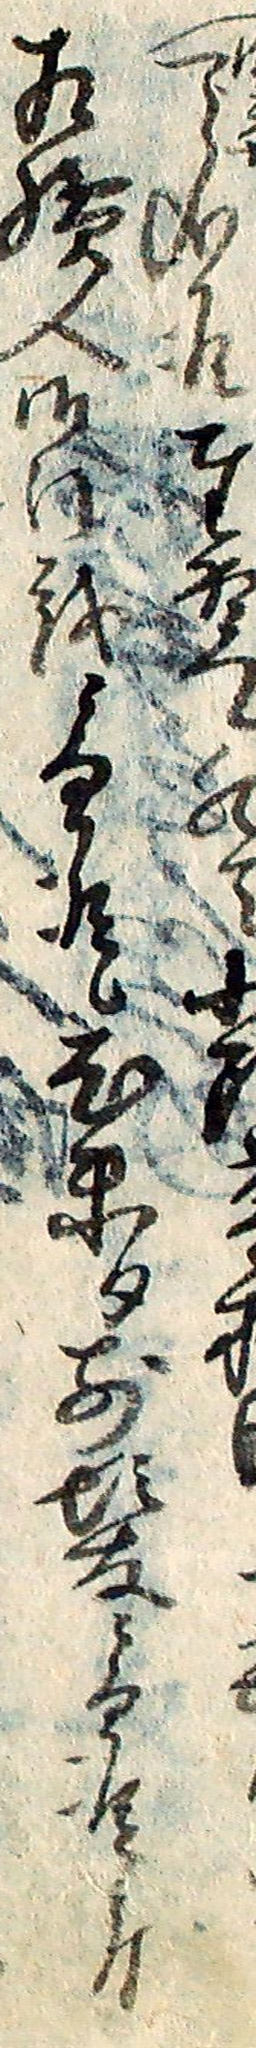相続人御引越にて御座候尤未た前髪にて御座候に付
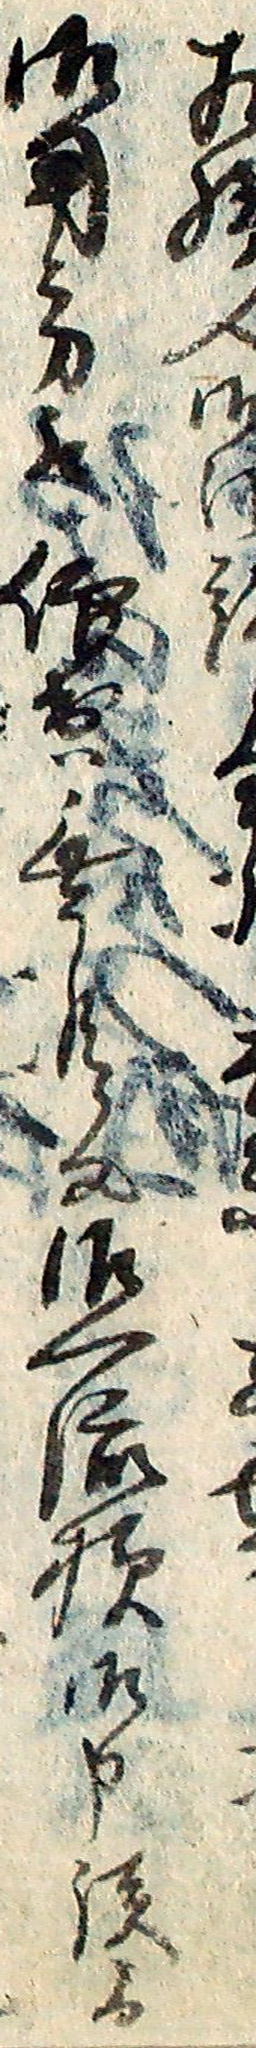御用方被仰出は無御座候共御一流様御申談にて
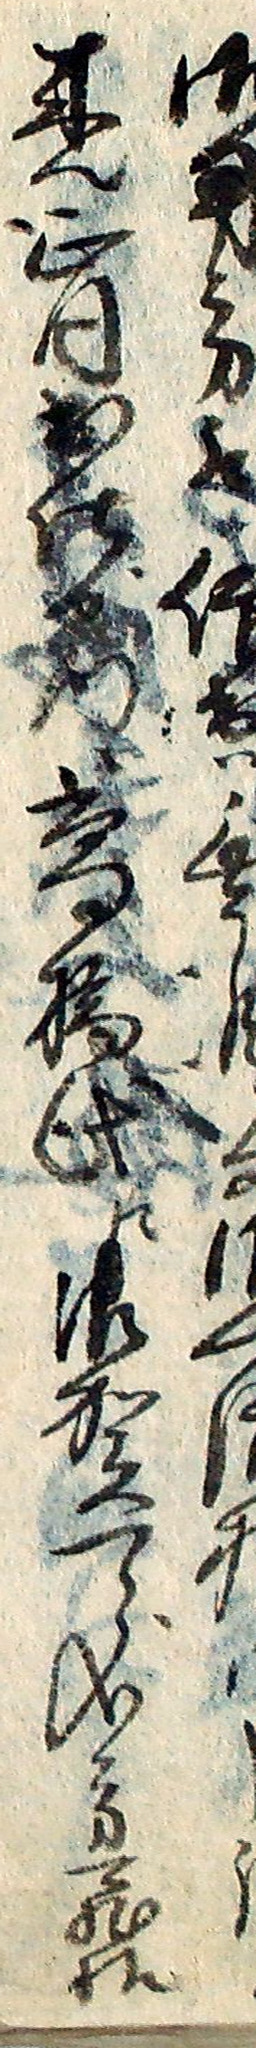来る正月出仕ゟ内々高橋氏え御賀可被成方可然様
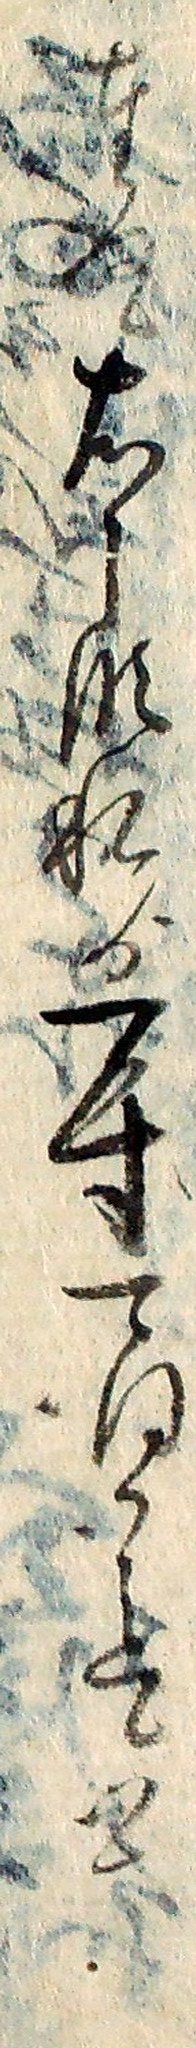奉存候右之段私ゟ一寸可得御意候以上
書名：諸御願書控(後藤氏壱番）
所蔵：鳴門教育大学 Naruto University of Education
